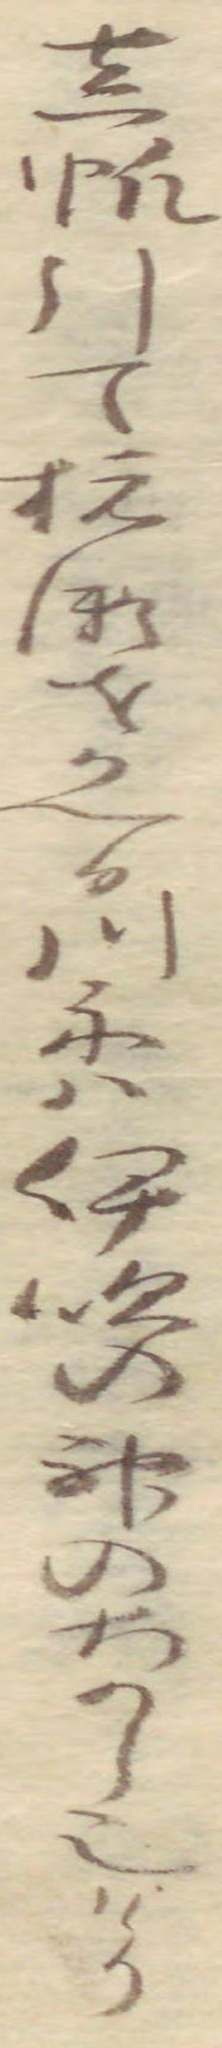真帆引て杭瀬をかへる川舟は伊吹の神のちから也けり
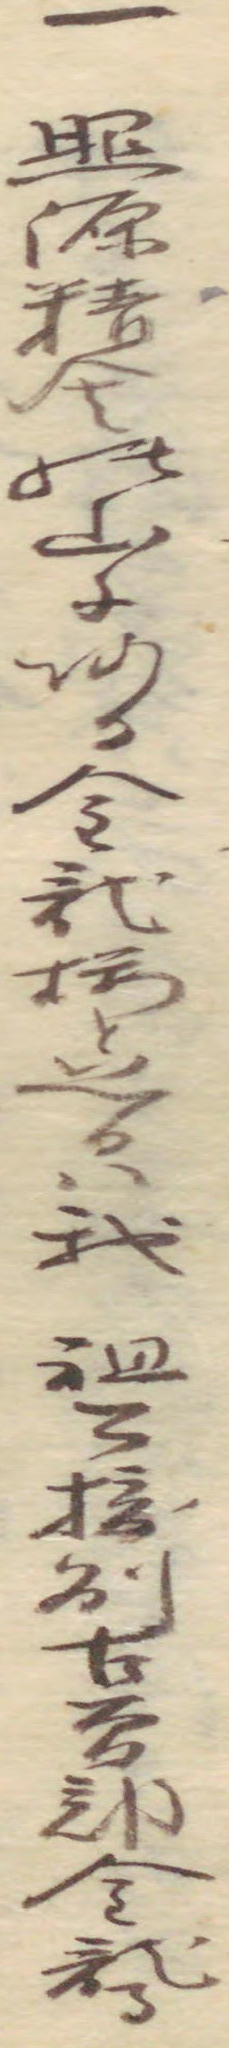一照源精舎の山にある金龍桜といへるは我祖公摂州古曽部金龍寺
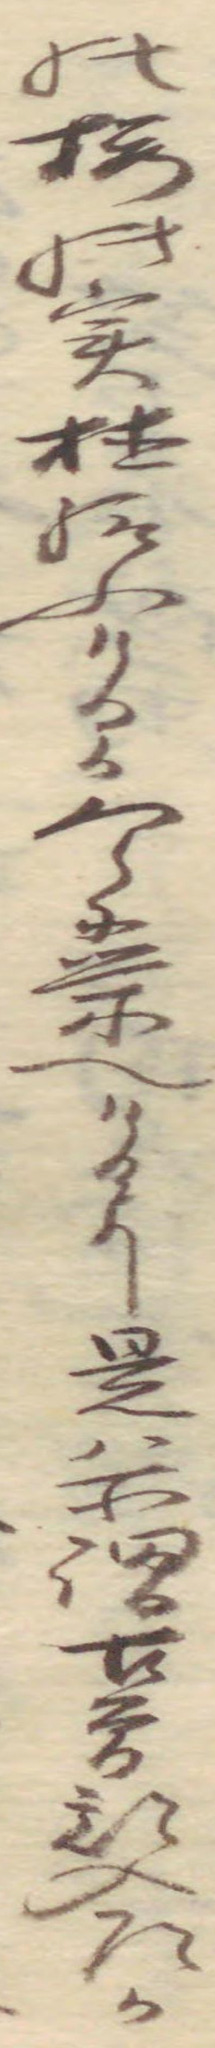の桜の実植給ふけるか今に栄へけるよし是は所謂古曽部入道か
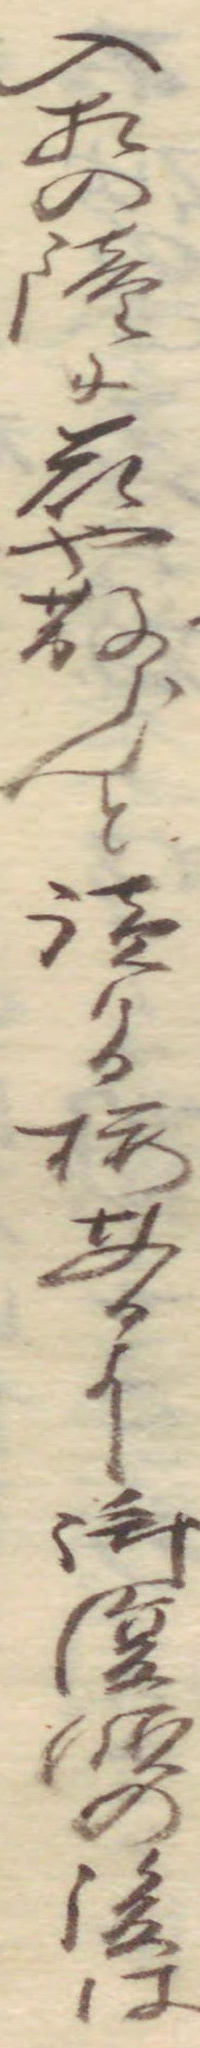入相の鐘に花や散らんと読ける桜なるよし御復領の後は
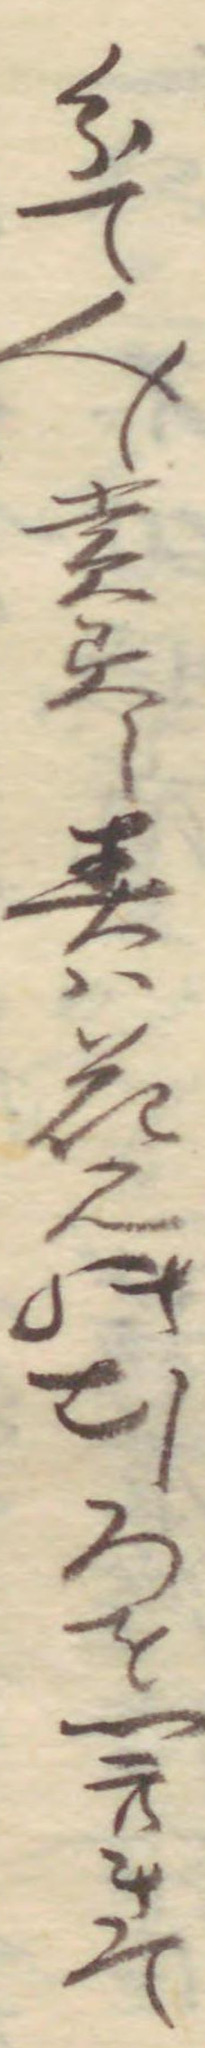分て人〳〵賞美し春は花見のむしろを開きて
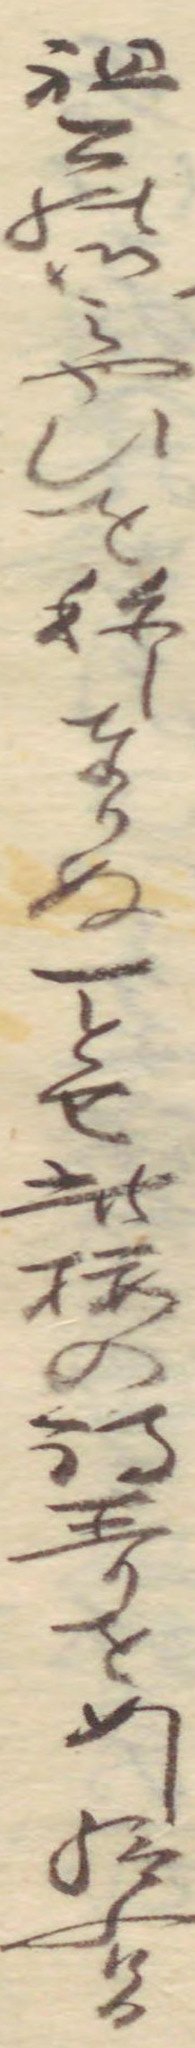祖公の御みやひを称し奉りぬ一とせ此桜の詩歌をめし給ふける
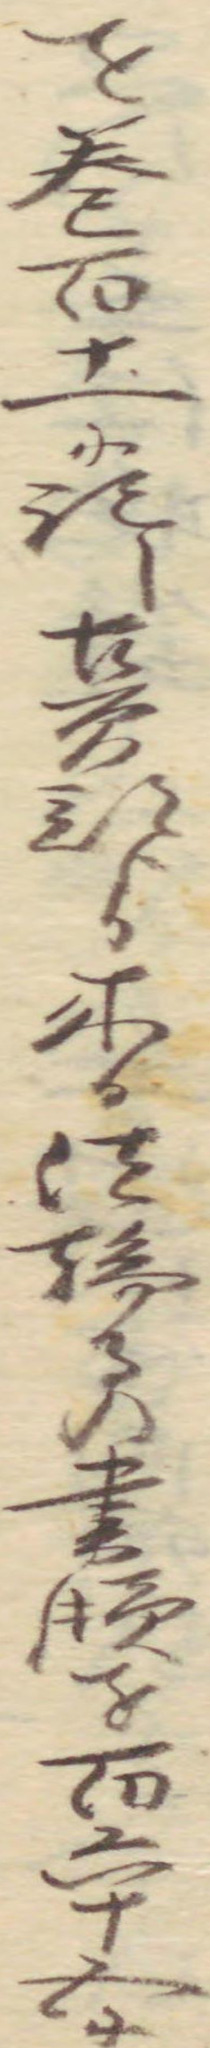を巻百十一に記し古曽部より来る法輪寺の書牘を百六十五に
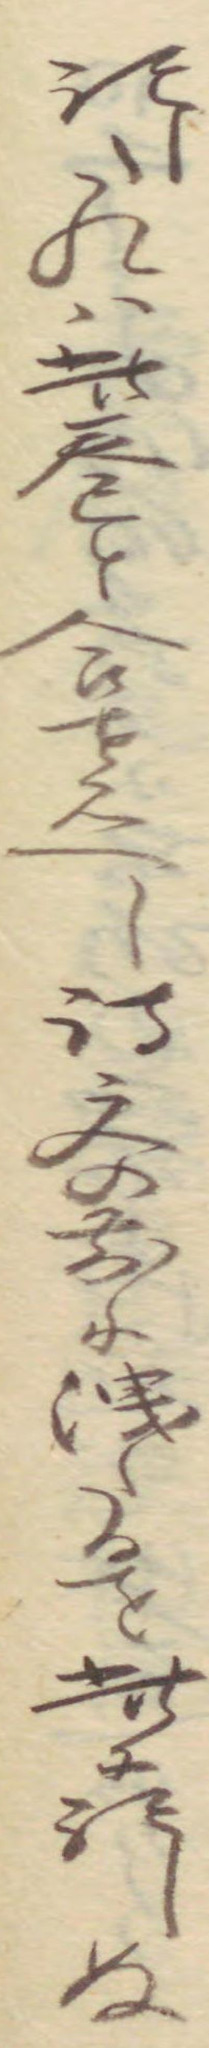記したれは此巻と合せ見へし詩文の前に漏たるを此に記しぬ
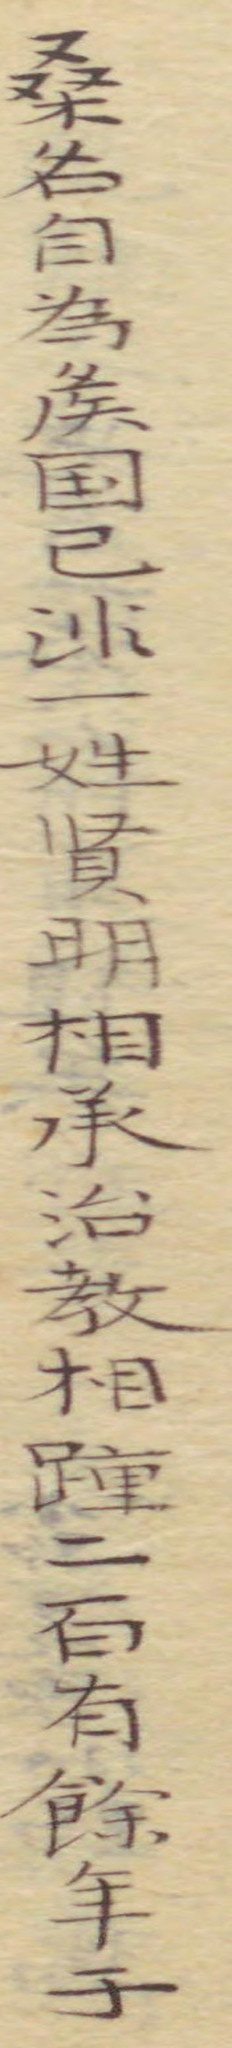桑名自為侯国己非一姓賢明相承治教相踵二百有餘年于
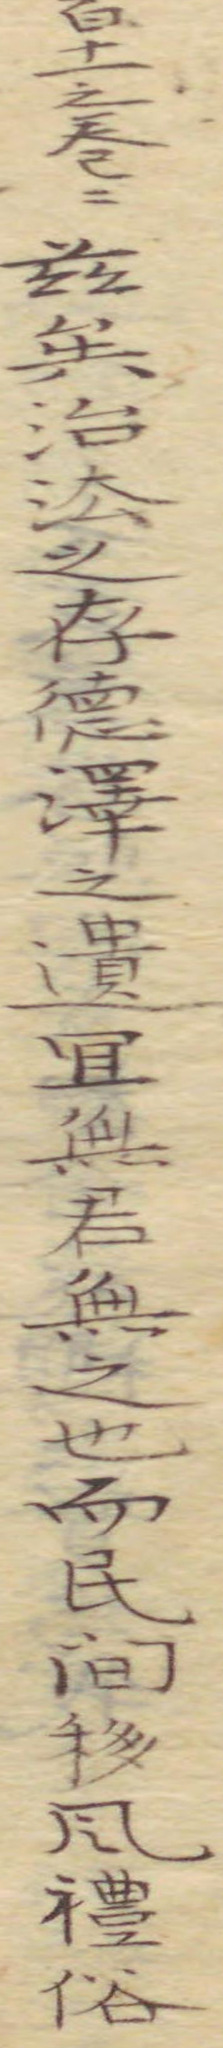茲矣治法之存徳澤之遺宜無君無之也而民間移風禮俗
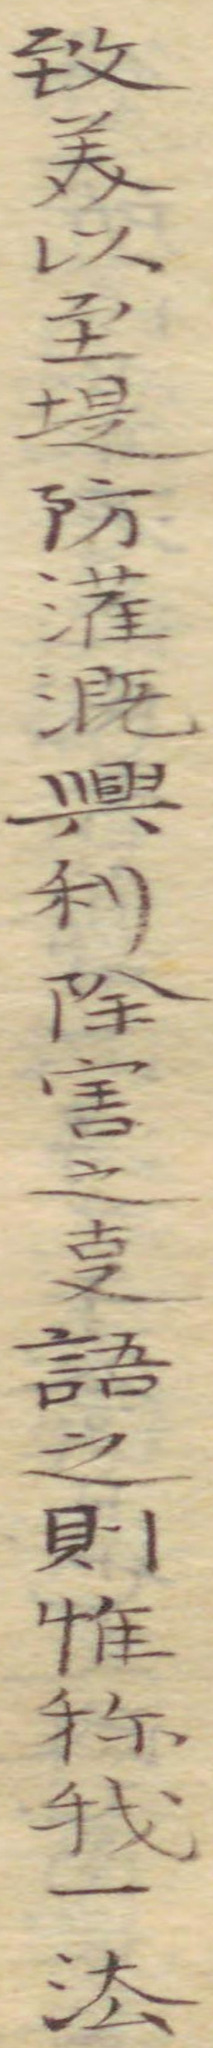致美以至堤防灌漑興利除害之事語之則惟称我一法
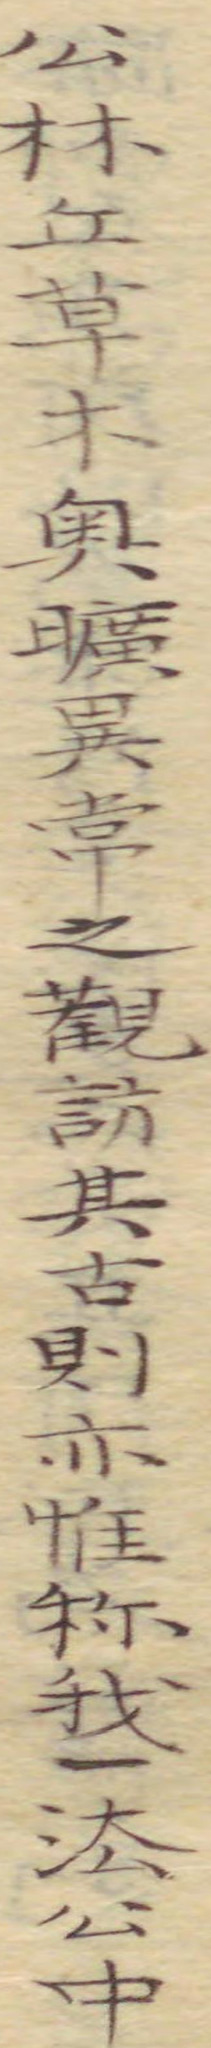公林丘草木奥曠異常之観訪其古則亦惟称我一法公中
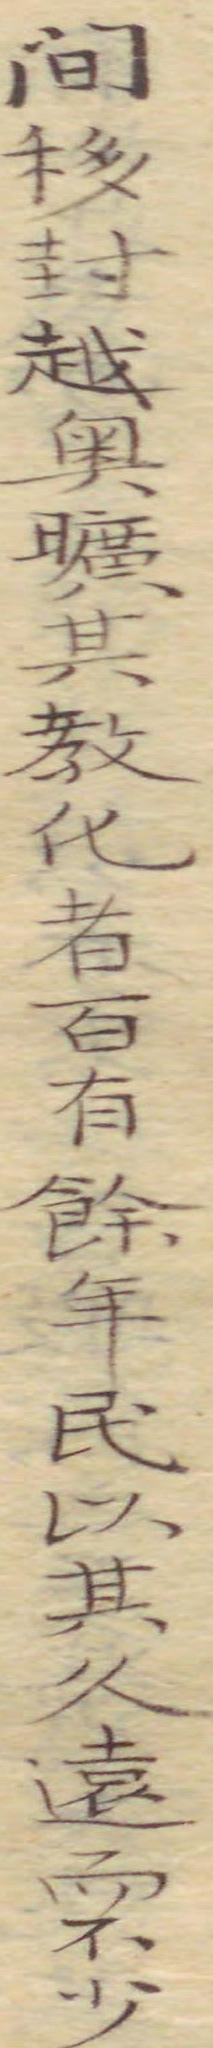間移封越奥曠其教化者百有餘年民以其久遠而不少
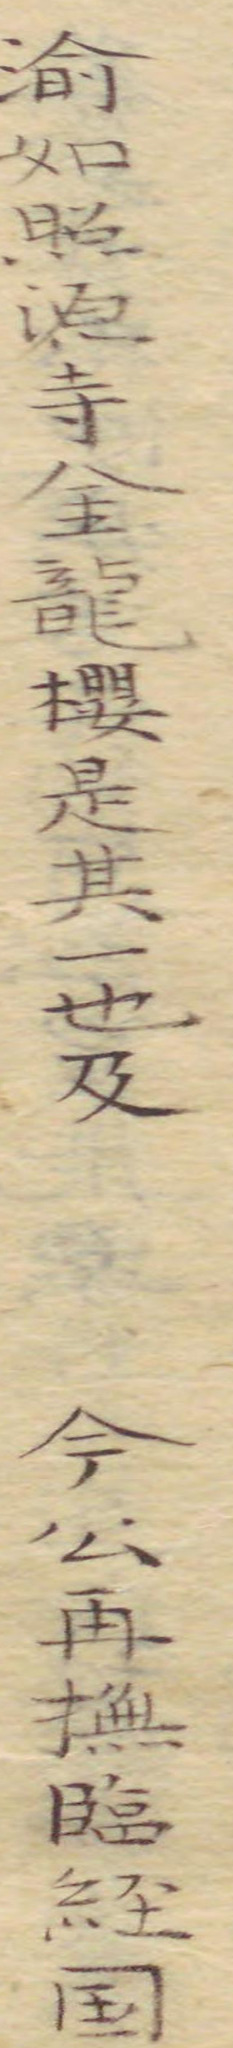渝如照源寺金龍櫻是其一也及今公再撫臨経国
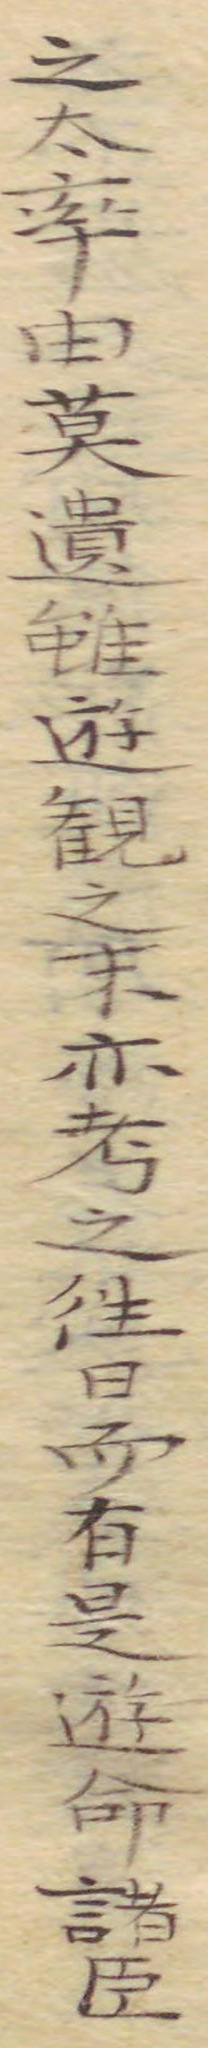之太率由莫遺雖遊観之末亦考之往日而有是遊命諸臣
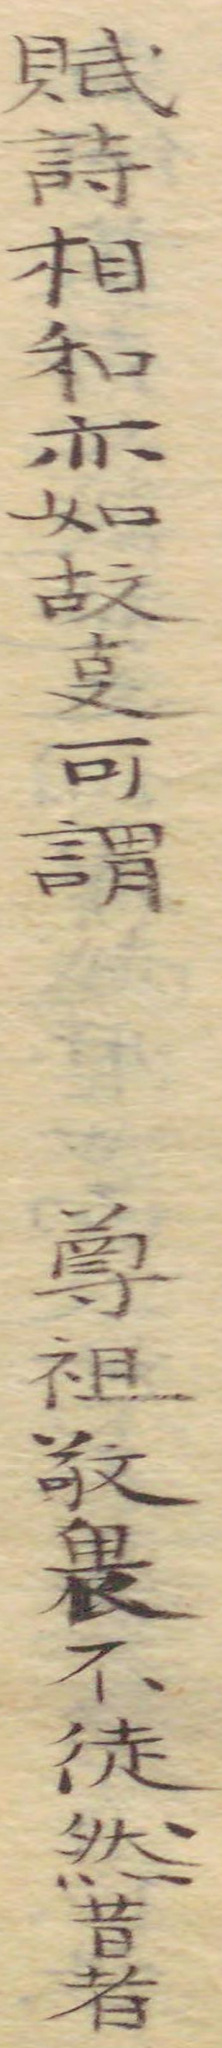賦詩相和亦如故事可謂尊祖敬畏不徒然昔者
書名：鶯宿雑記. 巻263-264
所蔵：国立国会図書館 National Diet Library, JAPAN
